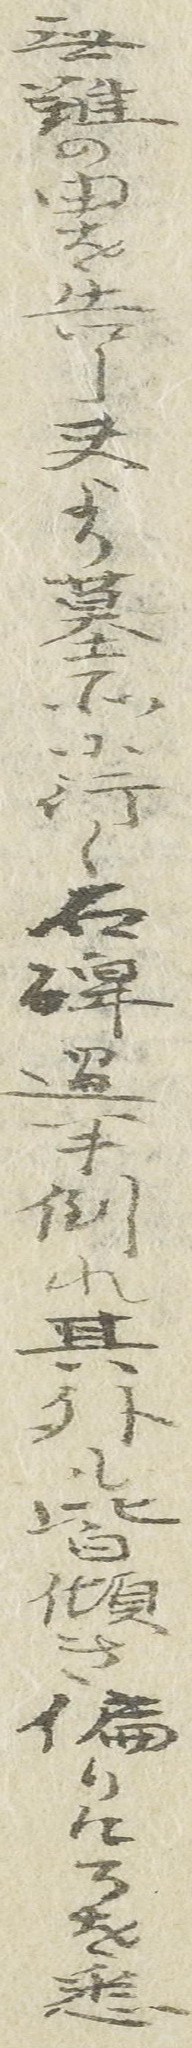無難の由を告し夫より墓所に行く石碑過半倒れ其外も皆傾き偏りけるを悉

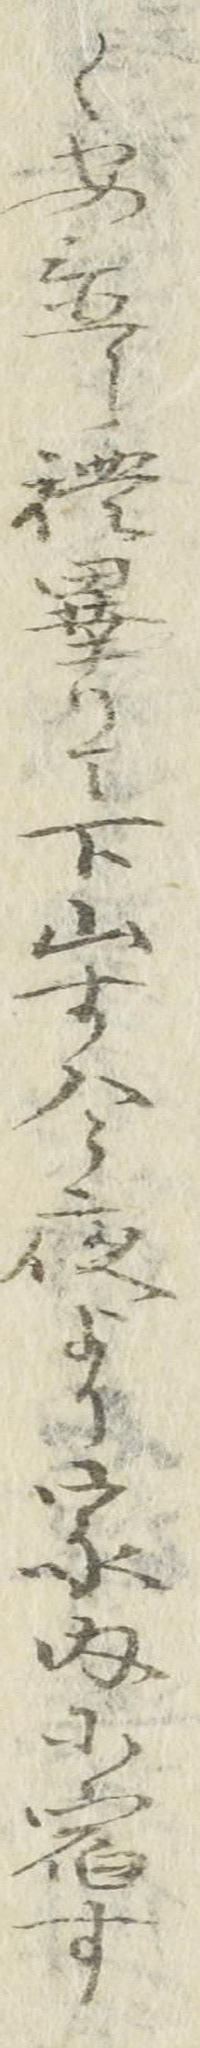く安置し礼畢りて下山す今夜より家内に宿す
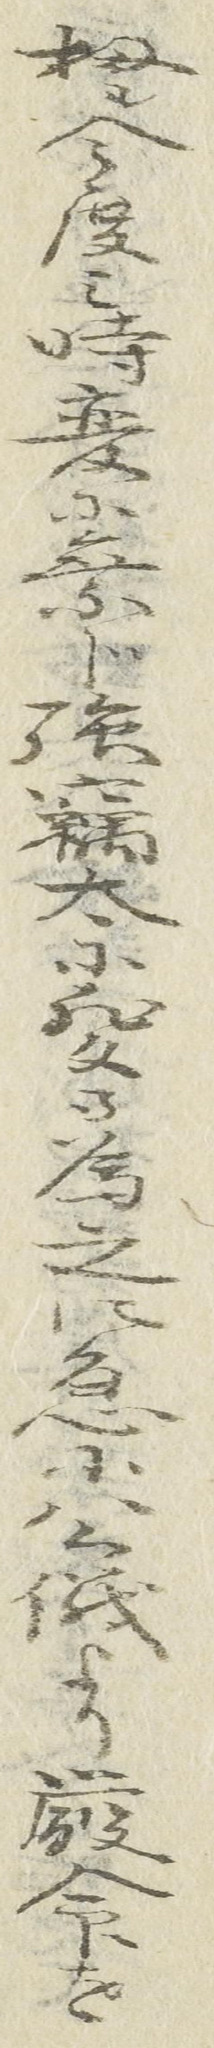扠も今度之時変に乗じ強竊太に発る為之に急に公儀より厳命を
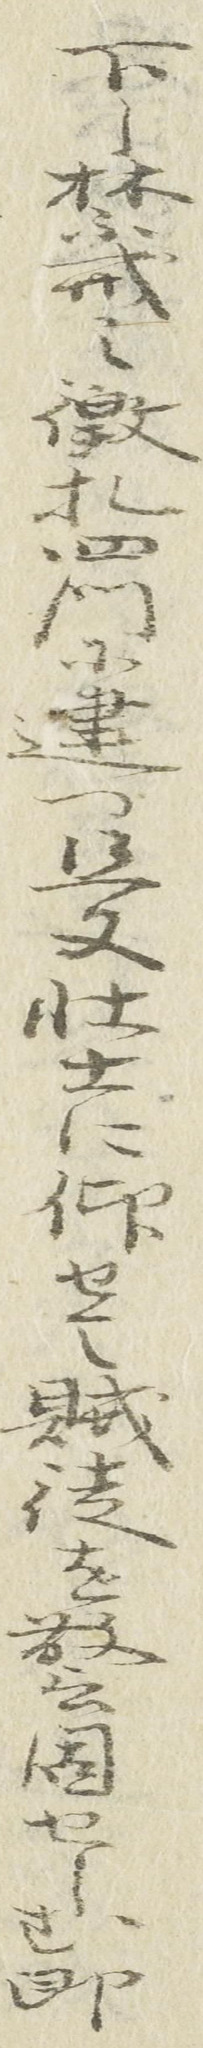下し禁戒之檄札四門に建つ且又壮士に仰せの賊徒を警固せしむ即
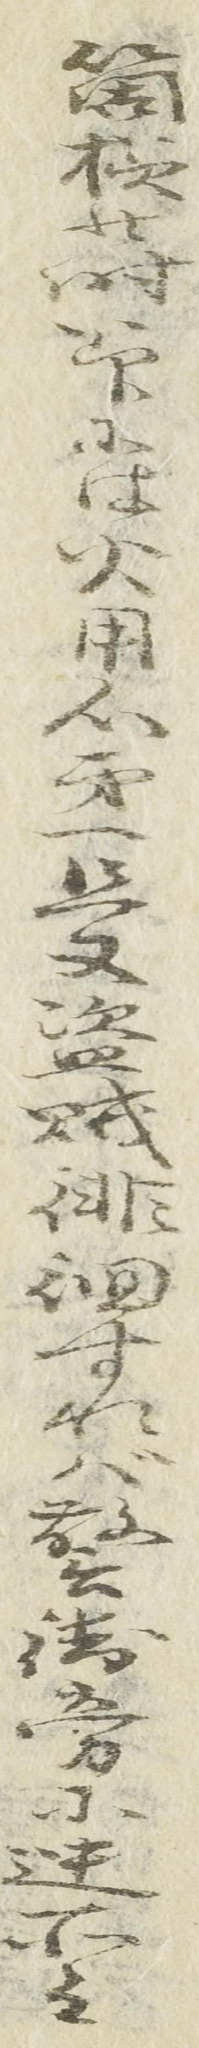箇様の時節には火用心第一且又盗賊徘徊すれば警衛旁に迚所々
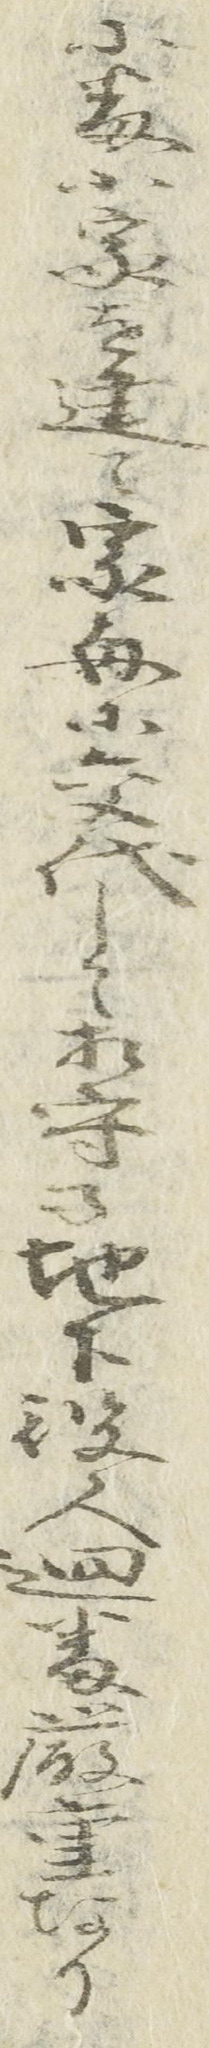に番小家を建て家毎に交代して相守る地下役人廻番厳重なり
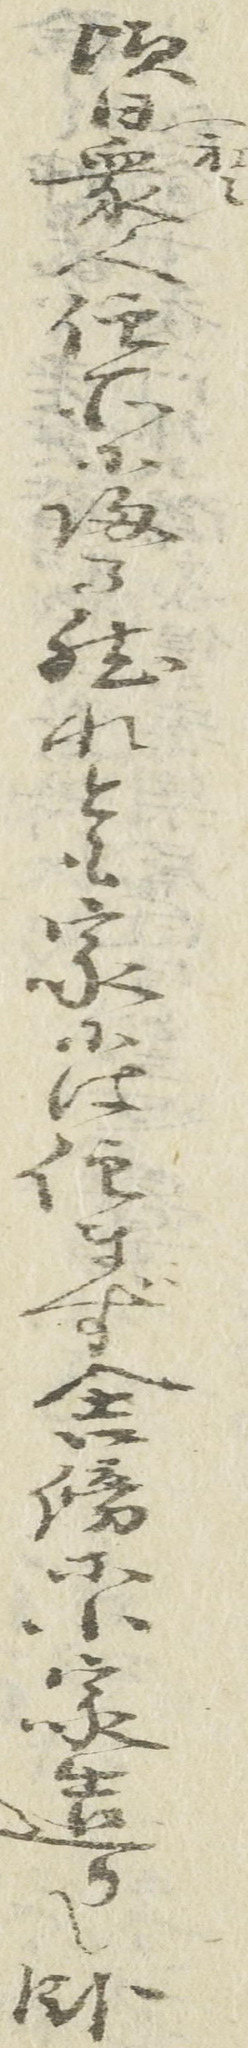頃日衆人住所に帰る然れとも家には住まず舎傍に小家造りし臥
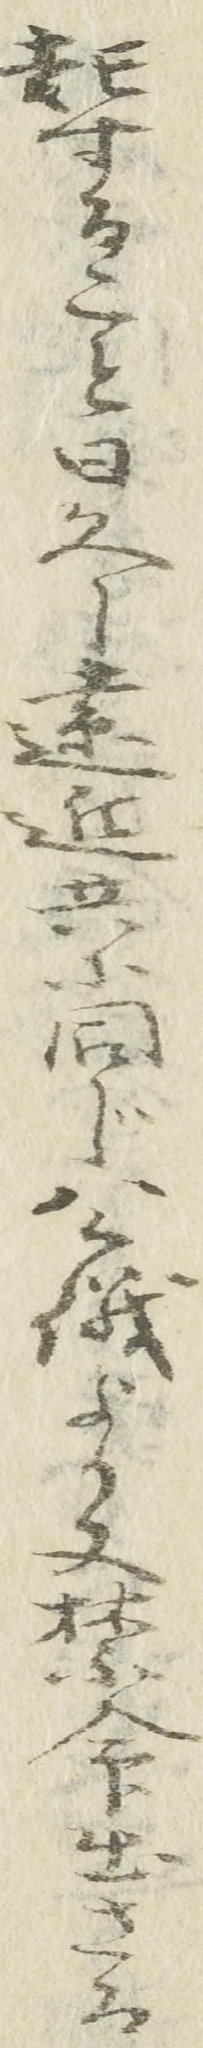起すること日久し遠近共に同じ公儀より又禁命出さる
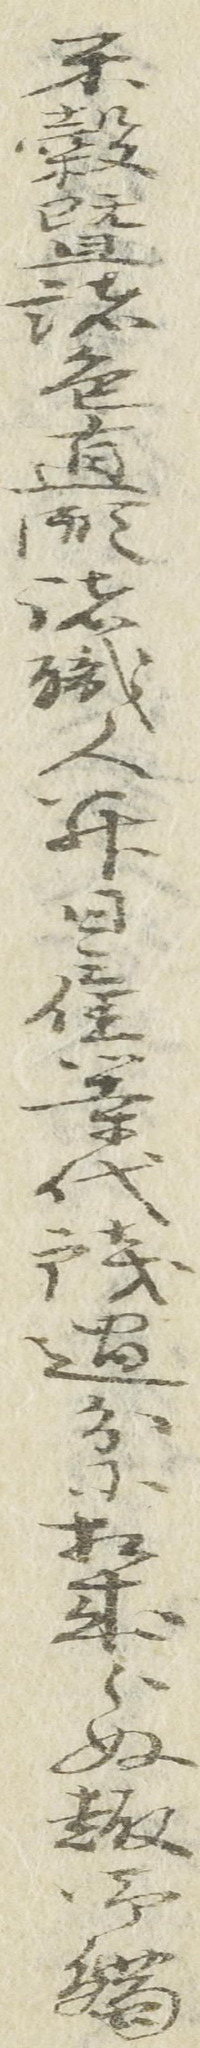米穀曁諸色直段諸職人并日雇等代銭過分に相成らぬ趣御触
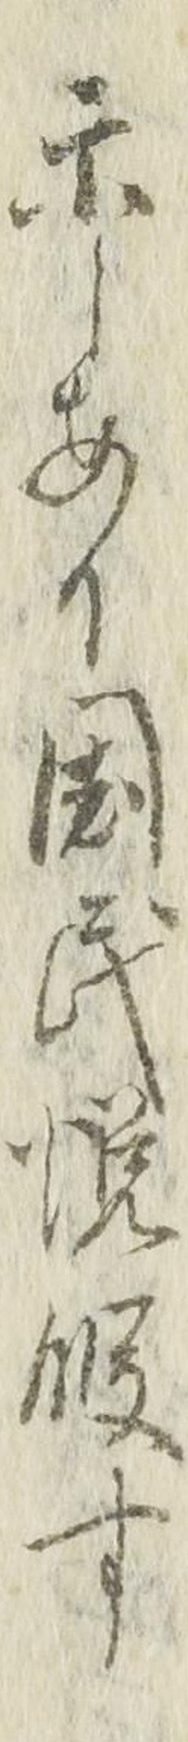示しあり困民悦服す

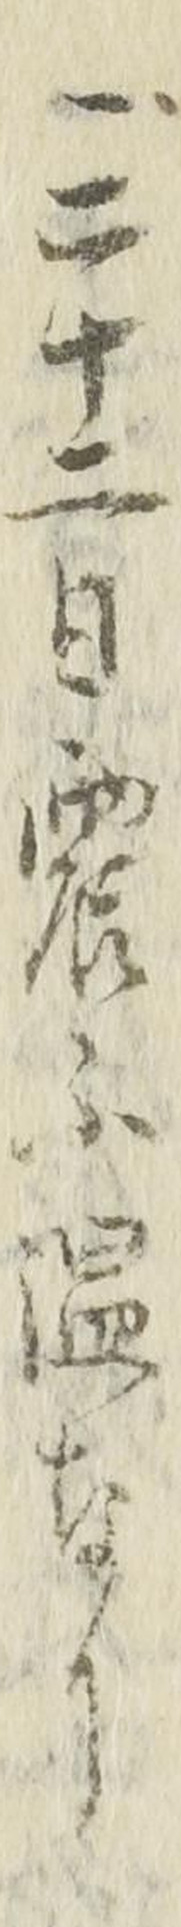一二十二日震ふ温なり
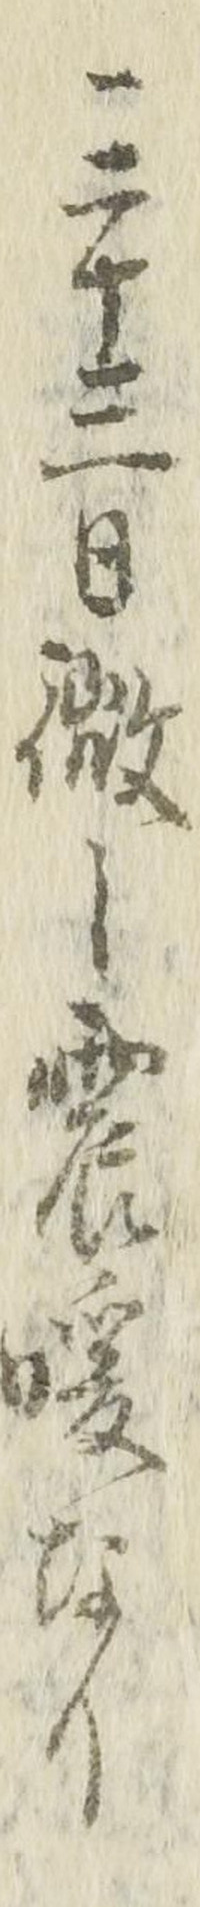一二十三日微し震暖なり
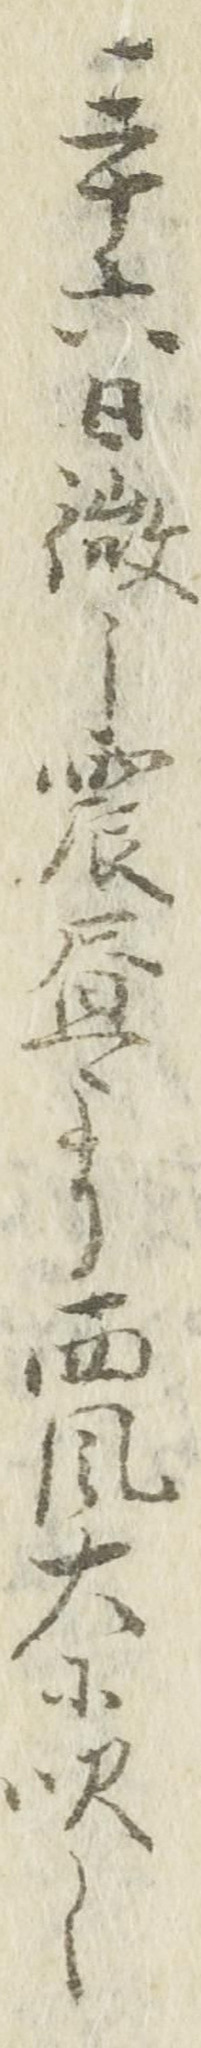一二十六日微し震昼より西風大に吹く
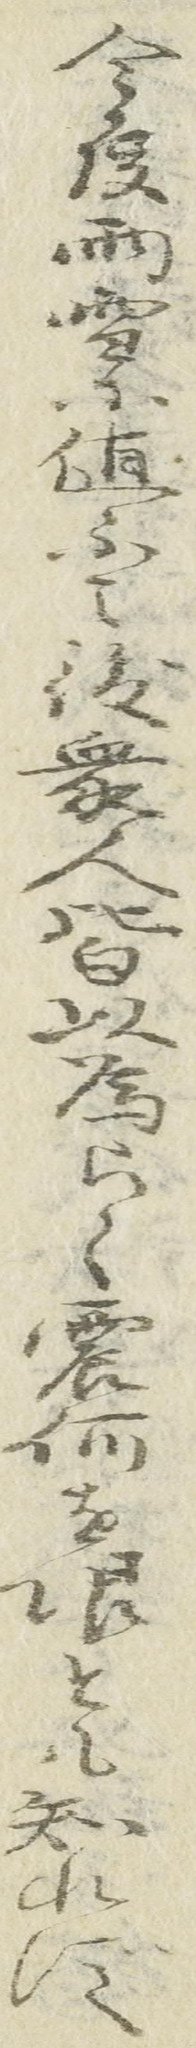今度雨雪に値ふて後衆人皆以為らく震何を限とも知れず
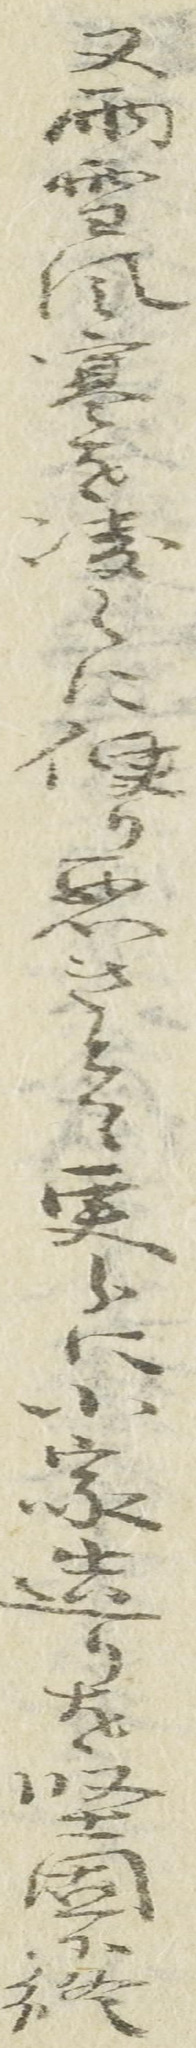又雨雪風寒を凌くに便り悪きとて更らに小家造りを堅固に修理
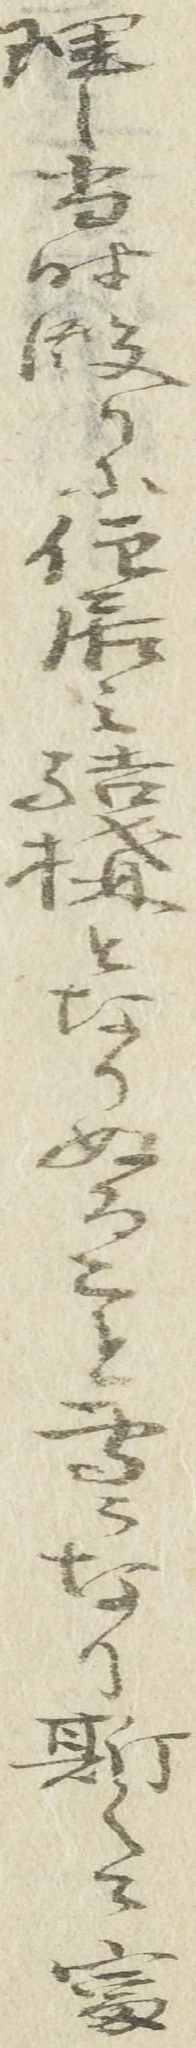理し当時仮りに住居之結構となりぬること専らなり斯くて富
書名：地震前兆集　全
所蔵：東京大学地震研究所図書室 Earthquake Research Institute Library, The University of Tokyo, JAPAN
